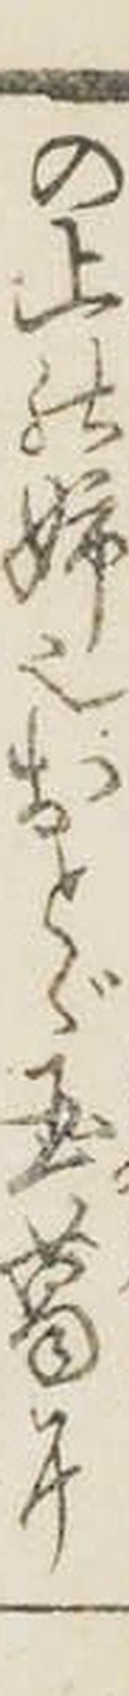の上の姉也おとゞ玉葛に
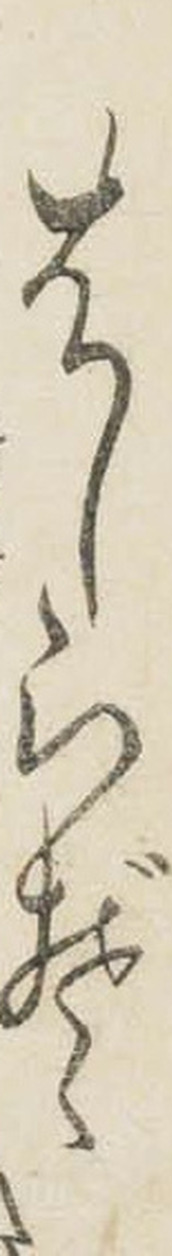はしらぞ
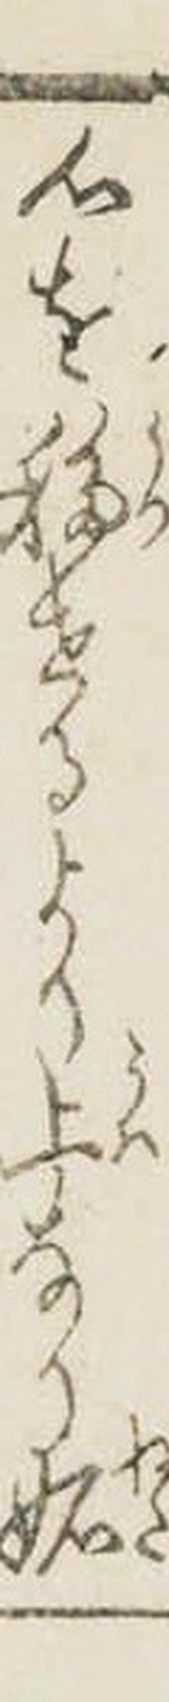心を移せるより上なり妬
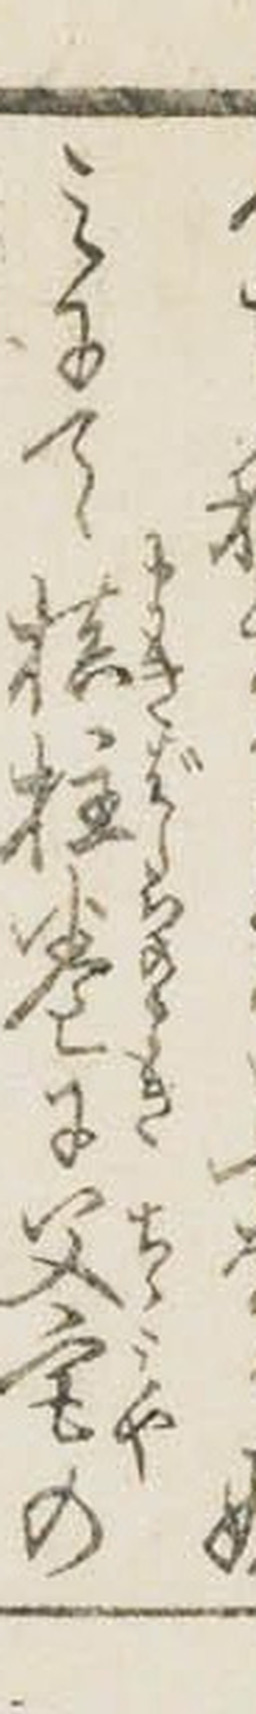みにて槙柱巻に父宮の
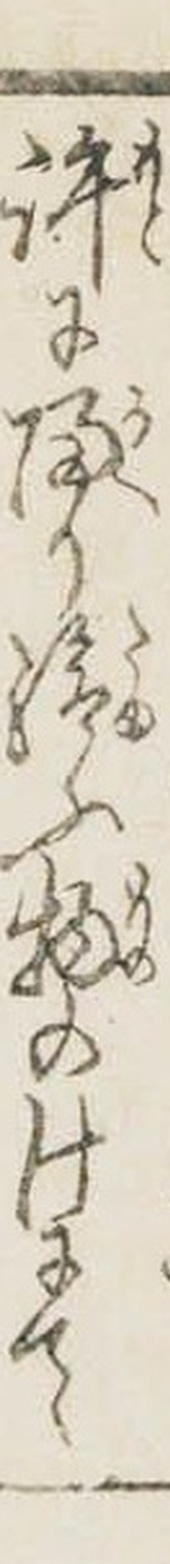許に帰り給ふ物のけにて
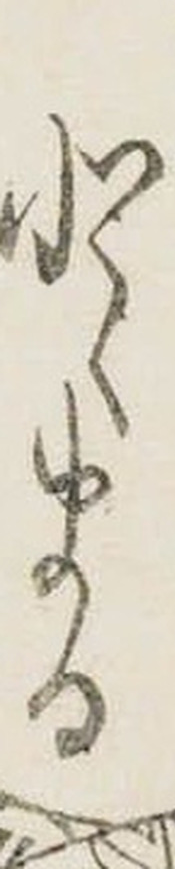とまる
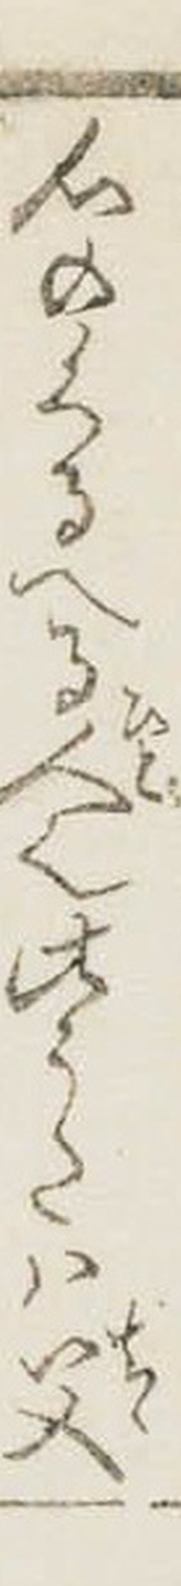心のくるへる人也此のうたは父
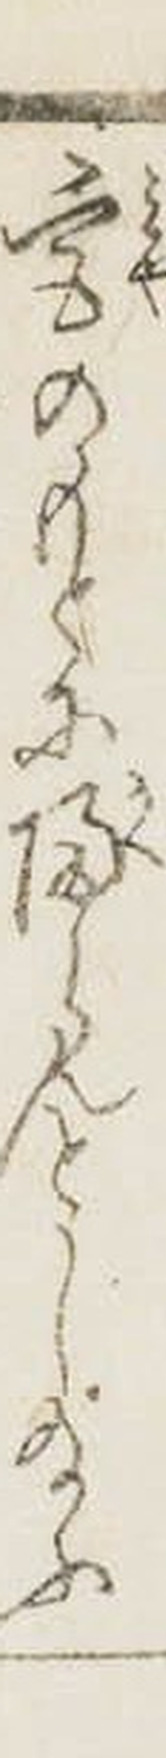宮のもとに帰らんとし給ふ
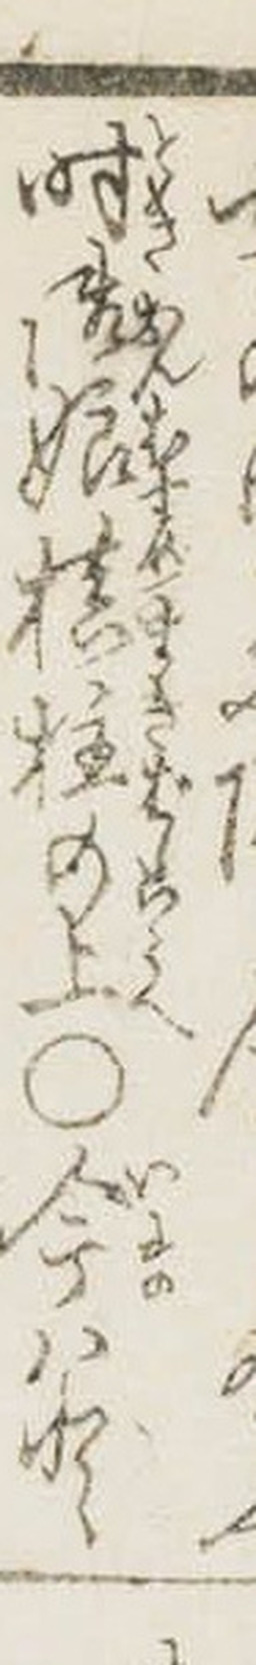時御娘槙柱の上○今はと
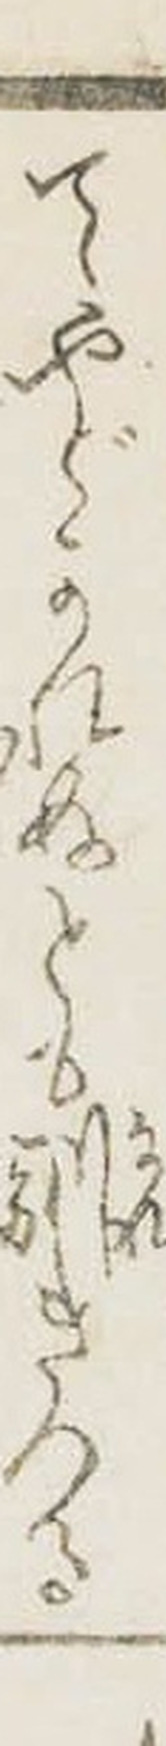てやどかれぬとも馴きつる
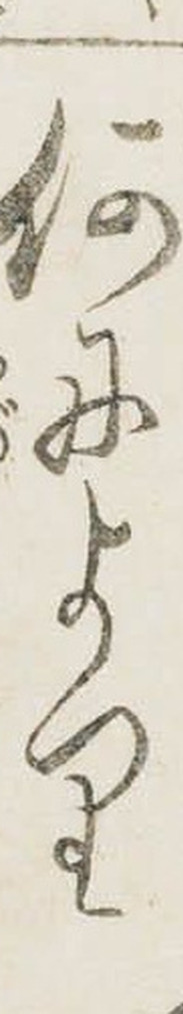何により
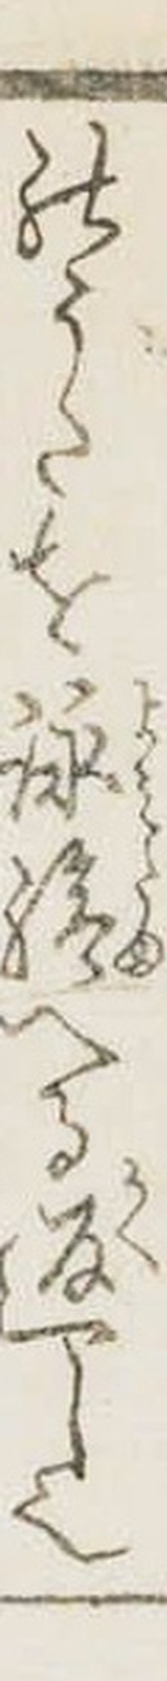のうたを詠給へる返し也
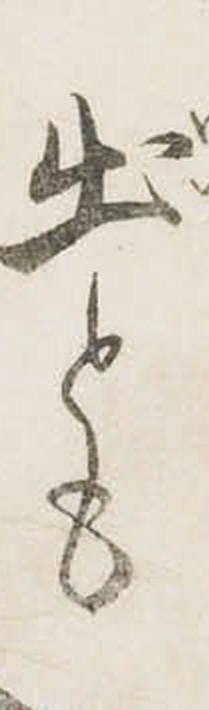出とも
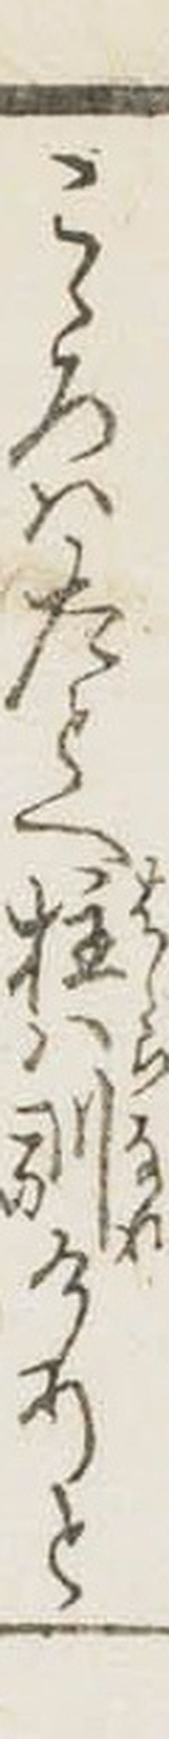こゝろはたとへ柱は馴けりと
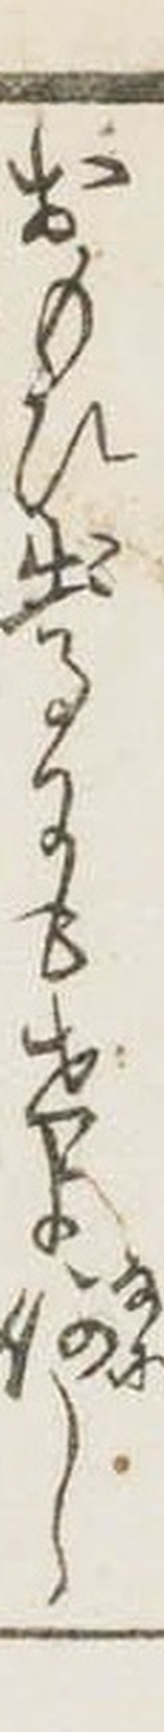おもひ出るにもせよ何し
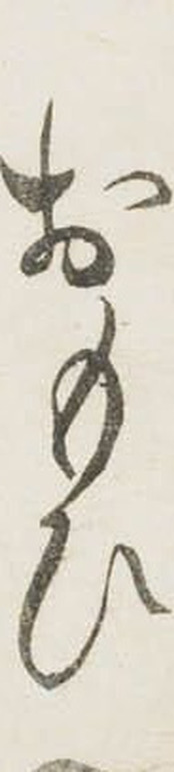おもひ
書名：源氏百人一首
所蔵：東京学芸大学教育コンテンツアーカイブ
